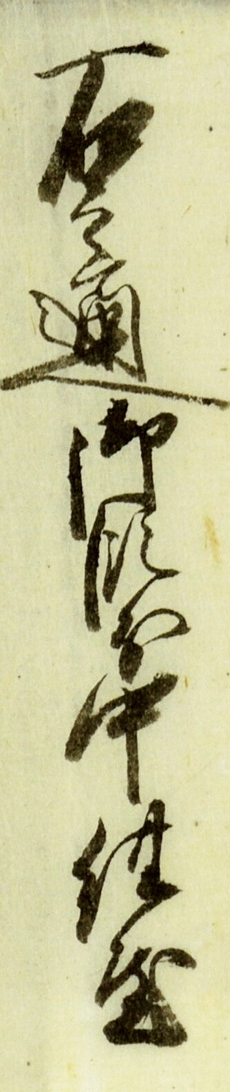右之通御領分中紺屋
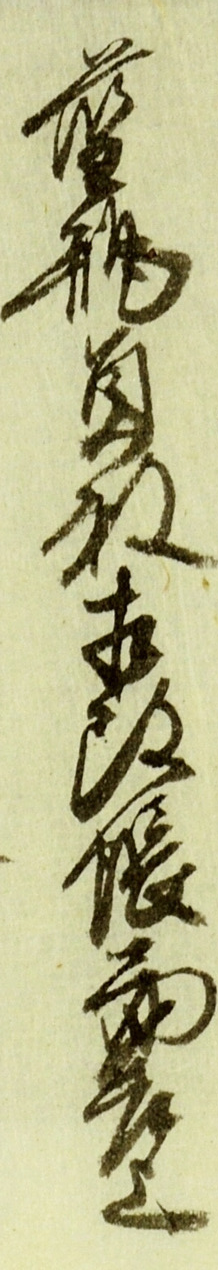藍瓶員数相改帳面差上
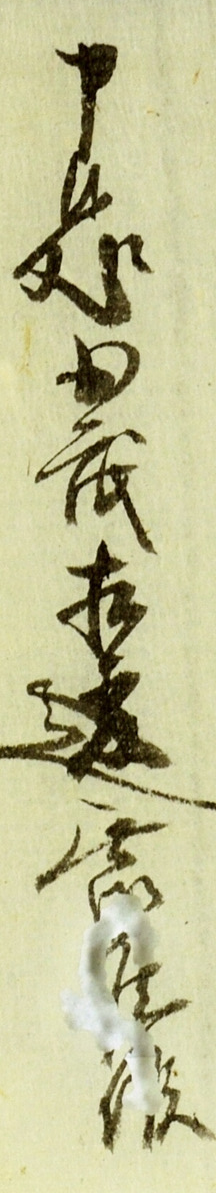申候処少も相違無御座候
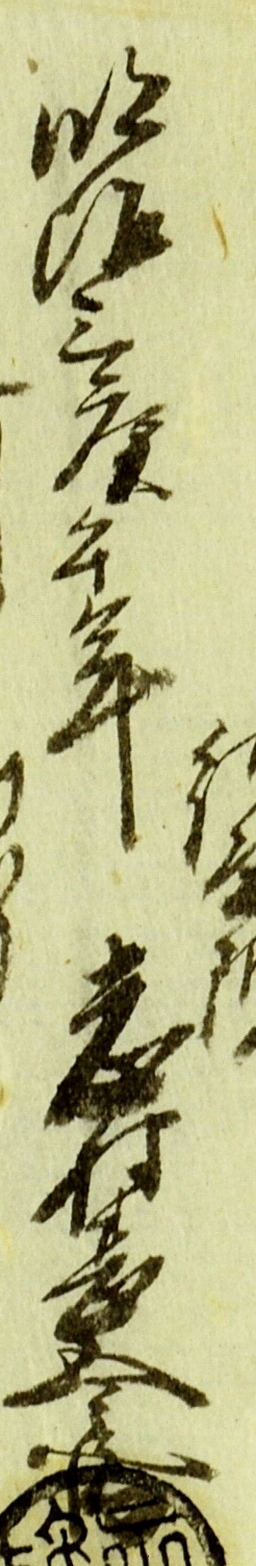明治三庚午年志村甚五兵衛㊞
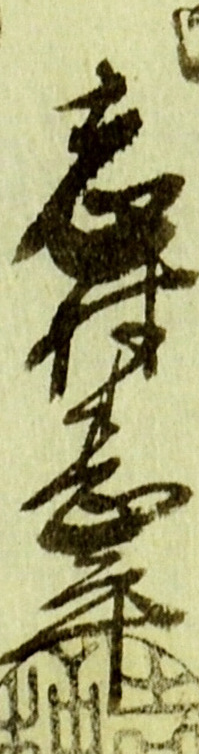志村甚平㊞
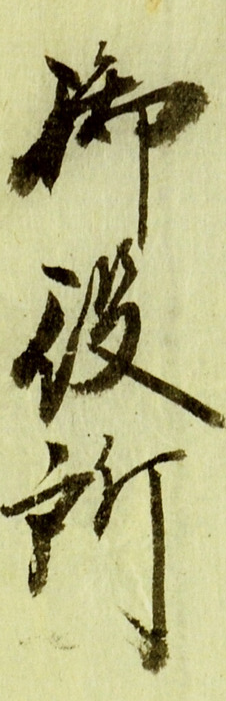御役所
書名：御領分中御領分中紺屋藍瓶員数御改帳
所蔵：伊那市立高遠町図書館・合同会社AMANE
